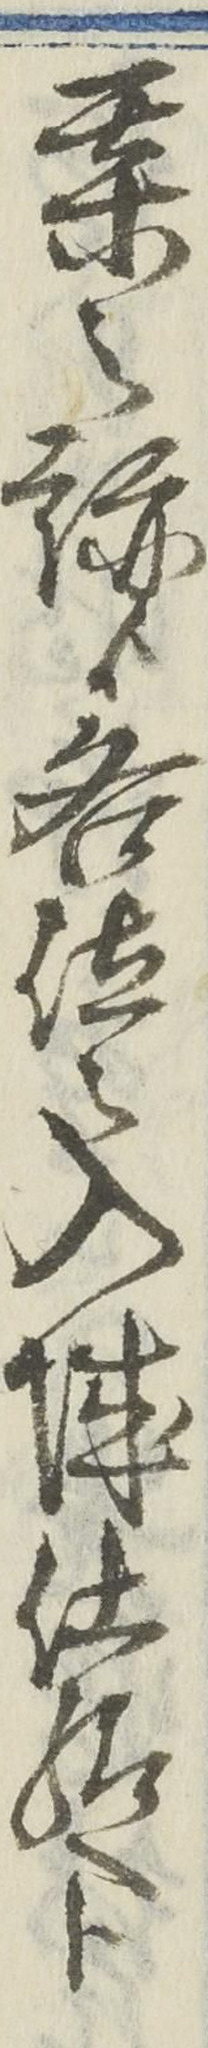某之跡ゟ各位ニ入城仕給へト
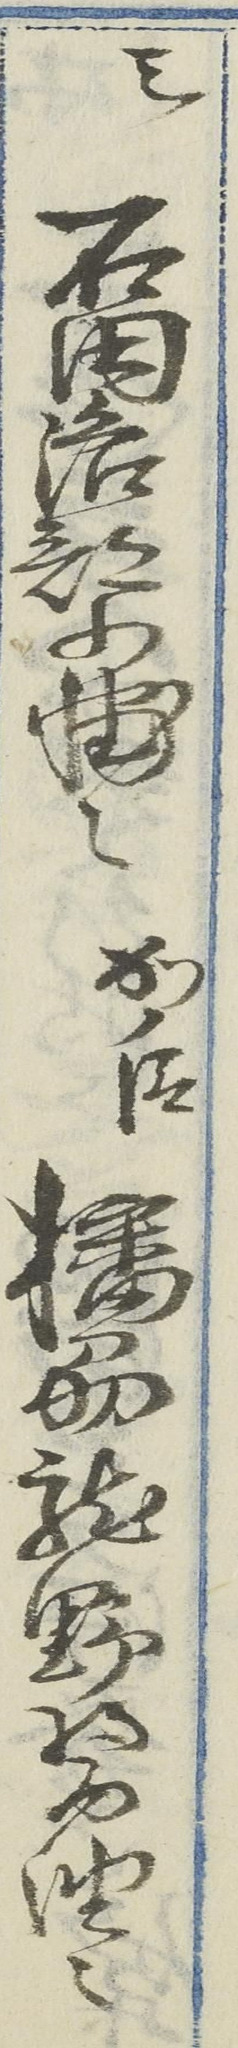云石田治部少輔ニ加ノ臣播州龍野醤油ニ
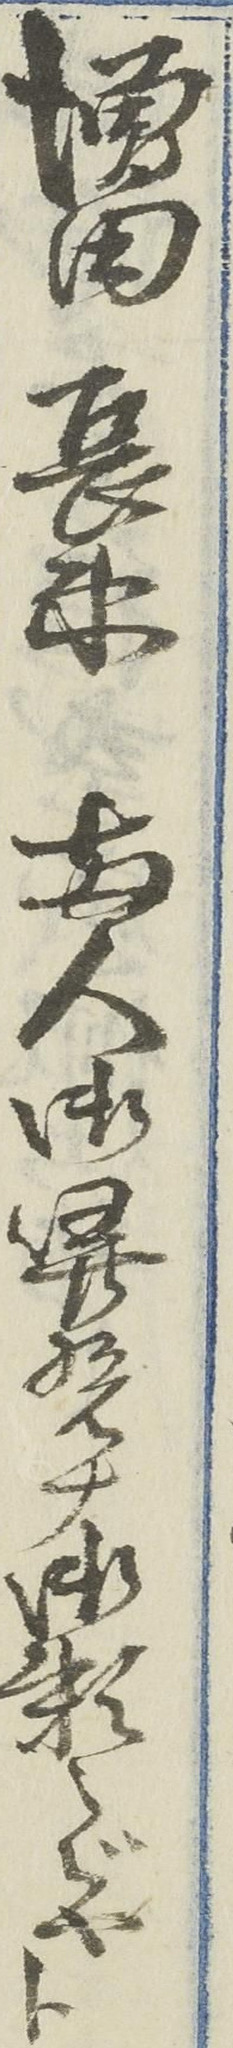増田長束両人御昇覧ヲ御頼じゃト
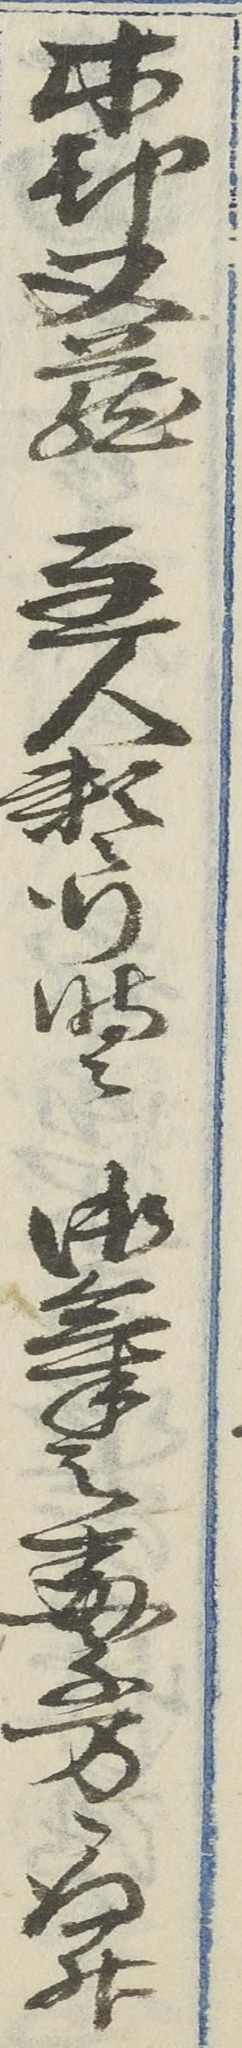木邨又蔵主人頼ミ行時ニ御気之毒千万ニ存外
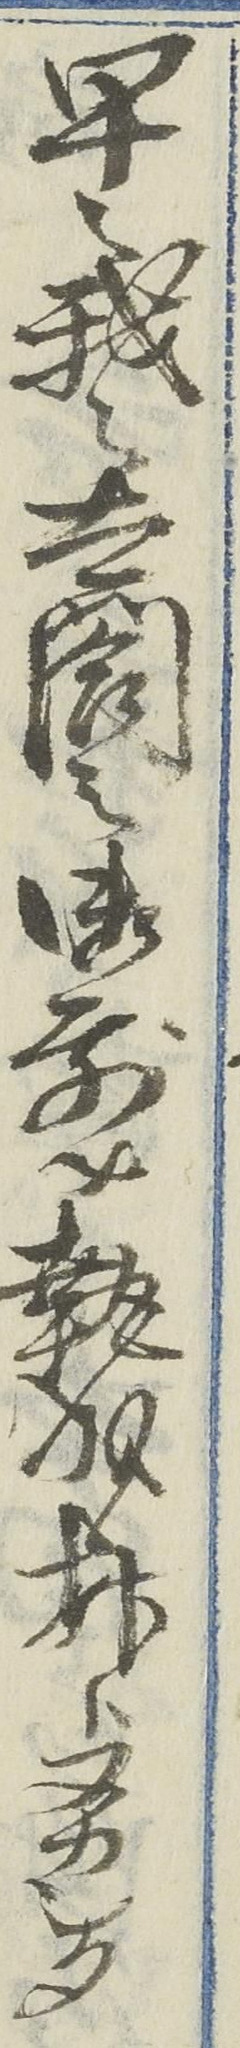早々我々太閤之御前ヲ執成抔トヌカシタ
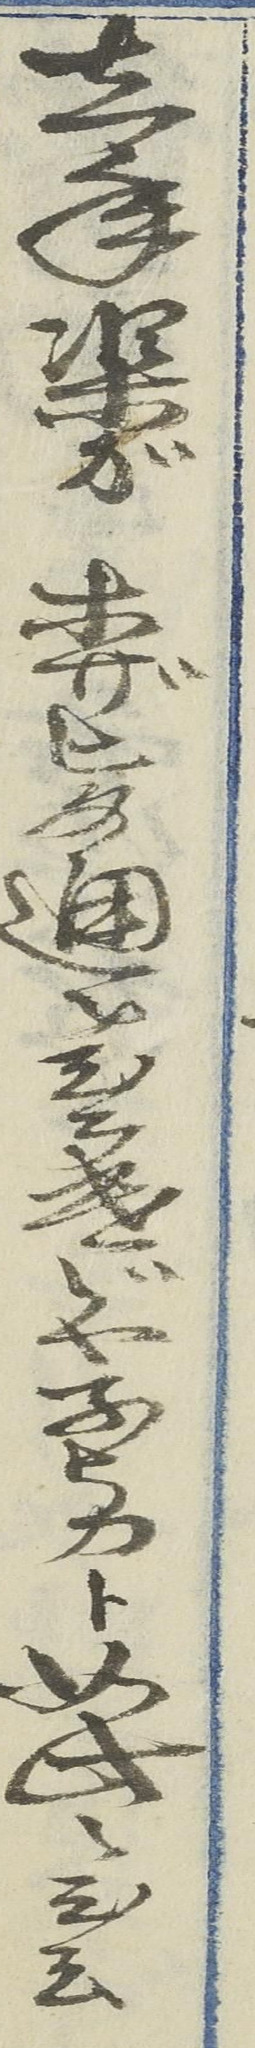去年渠がホザヒタ通ヲ云云けじゃ子ヒカト如此ニ云云

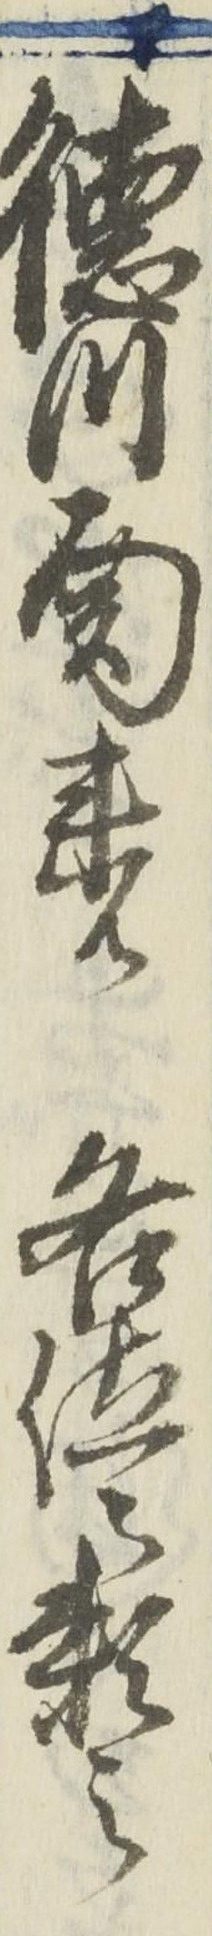徳川殿来ル各位ニ頼ミ
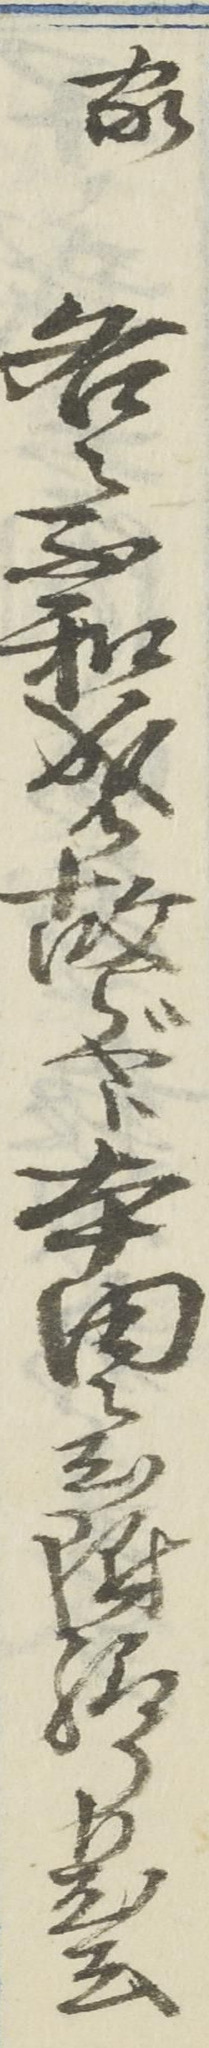家各々不和成ル故じやト本田ニ云附給うト云去
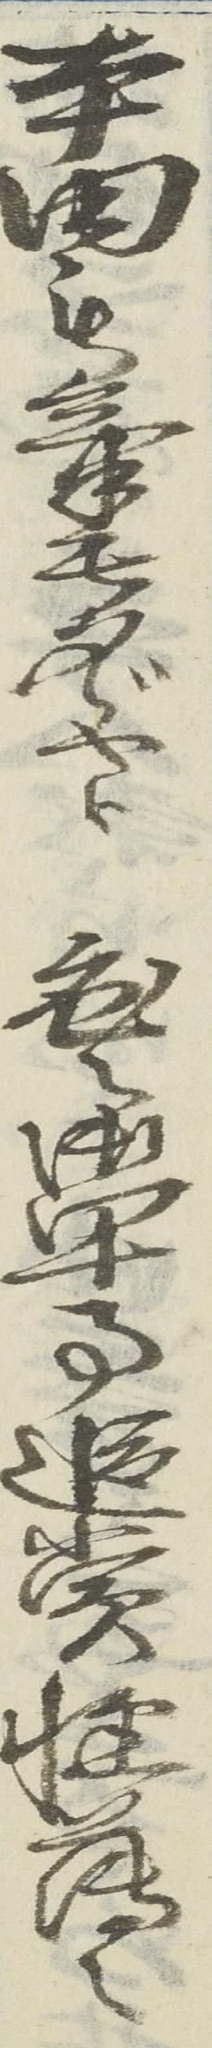本田も気モタじやト色々御早事追賞軽薄〻
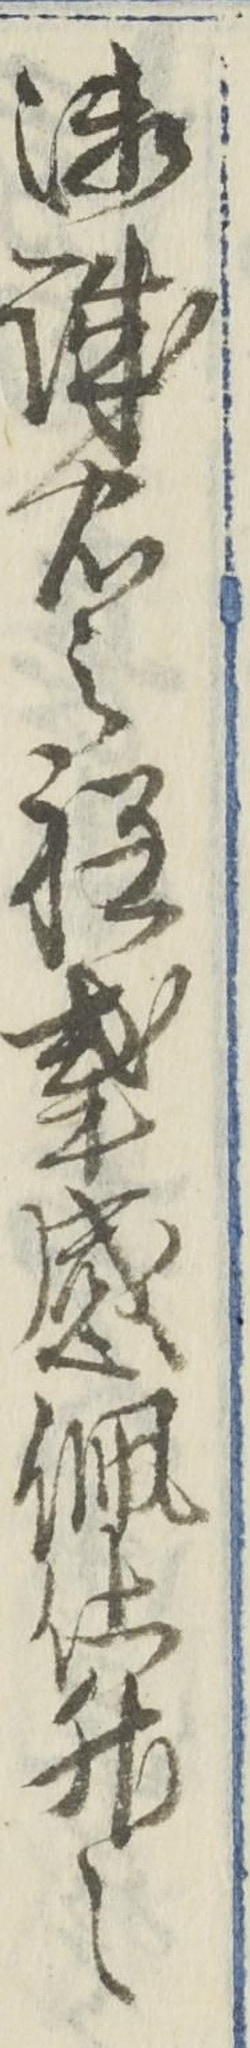御誠忠之程奉感佩仕升〻
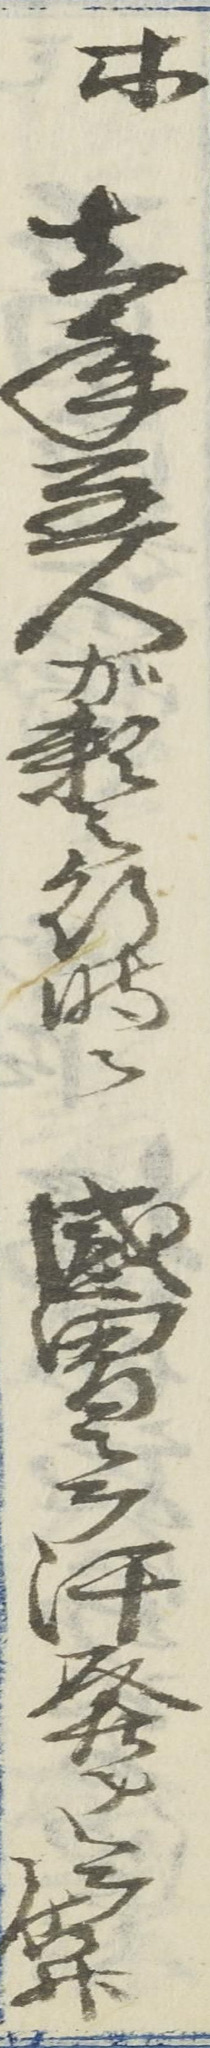木去年主人が頼ミ行時ニ感冒ニテ汗発ヲシテ居升
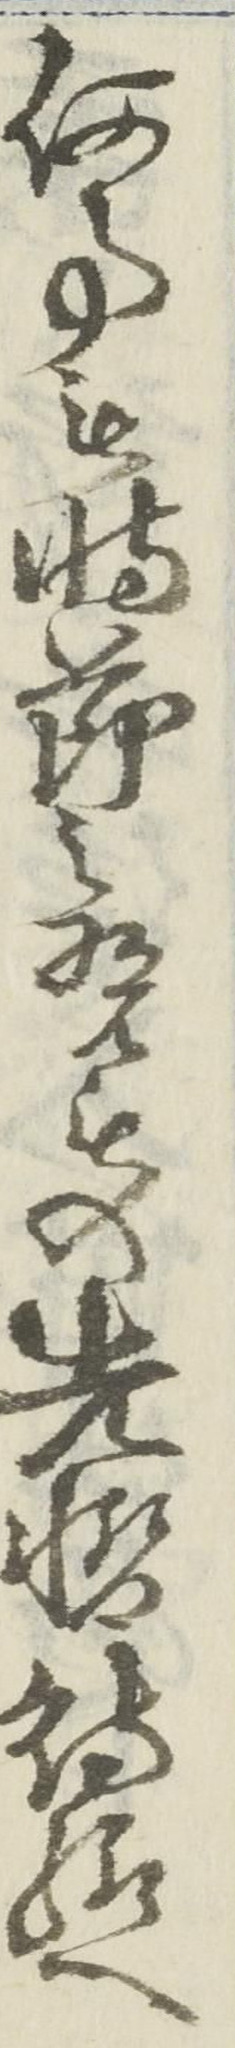何事も時節之有もの先暫待給へ
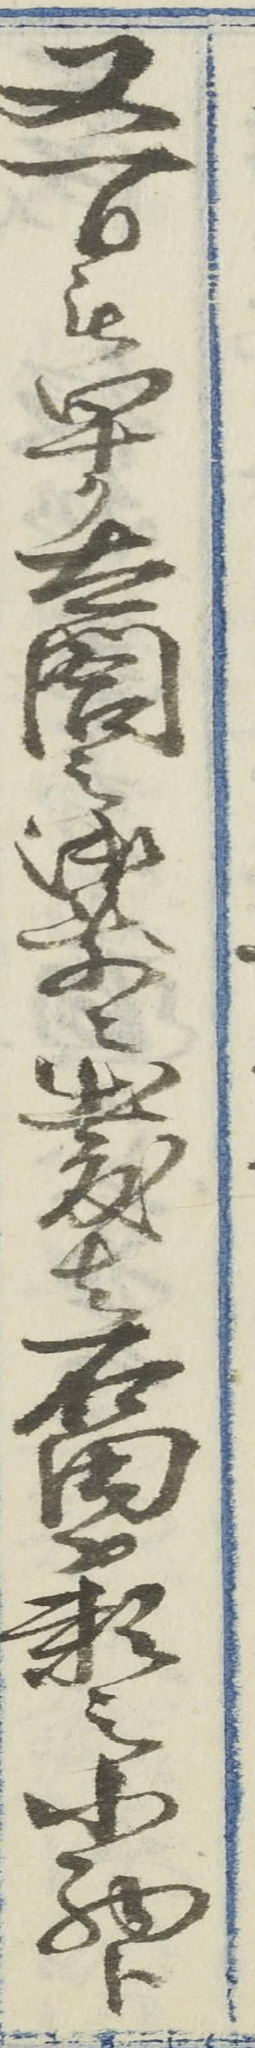又一日も早ク太閤之御前ニ出度は石田ヲ頼ミ小西ト
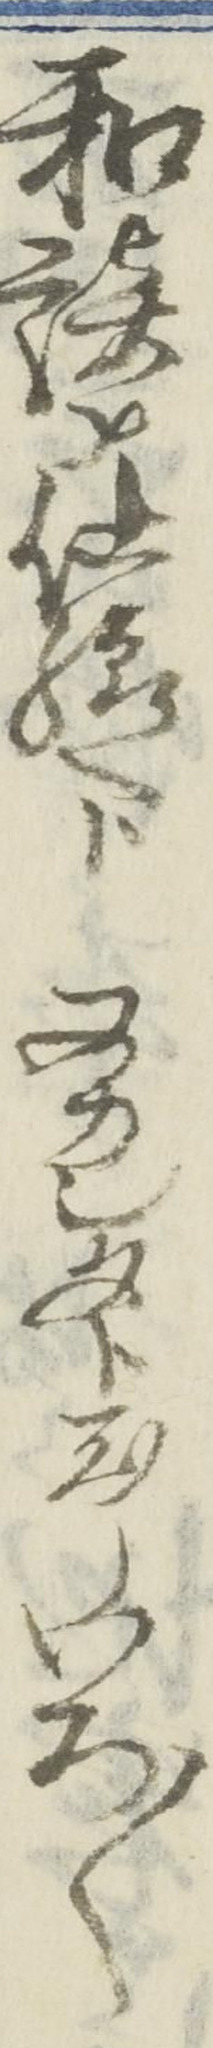和談ヲ仕給へトヌカシタト云しいろ〳〵
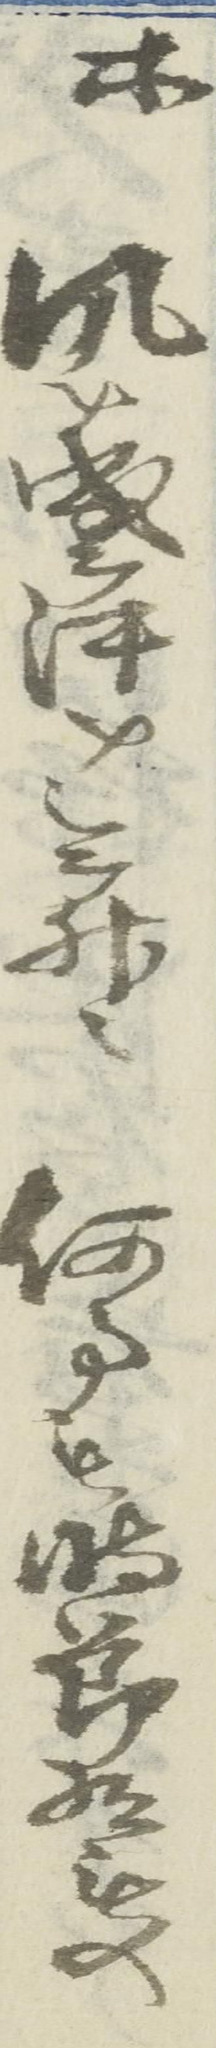木風ヲ曳テ汗ヲシテ升〻何事も時節有もの
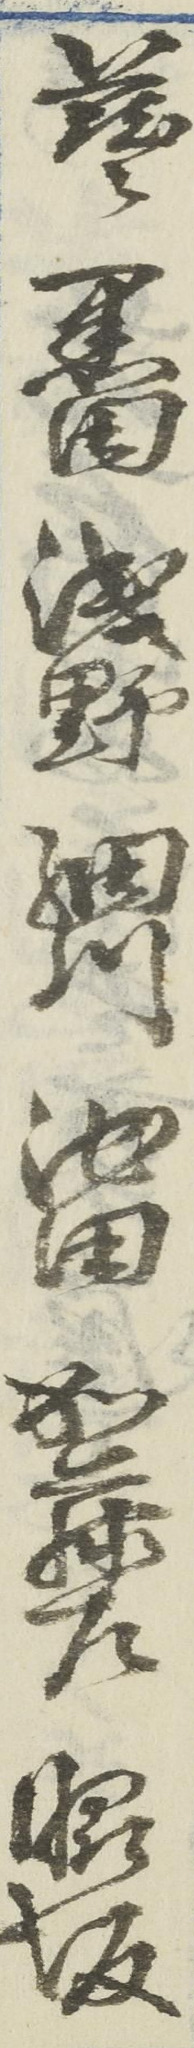茲ニ黒田浅野細川池田加藤左脇坂
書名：伏水大地震
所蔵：東京大学地震研究所図書室 Earthquake Research Institute Library, The University of Tokyo, JAPAN
